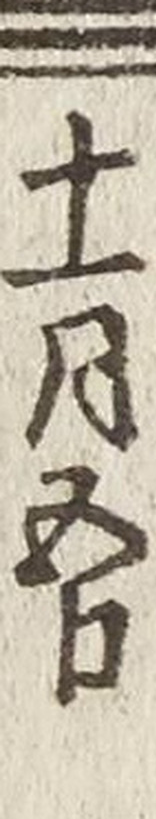十一月五日
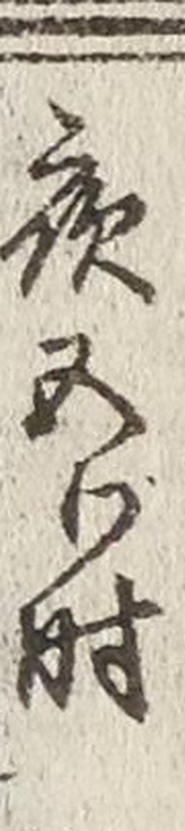夜五ツ時
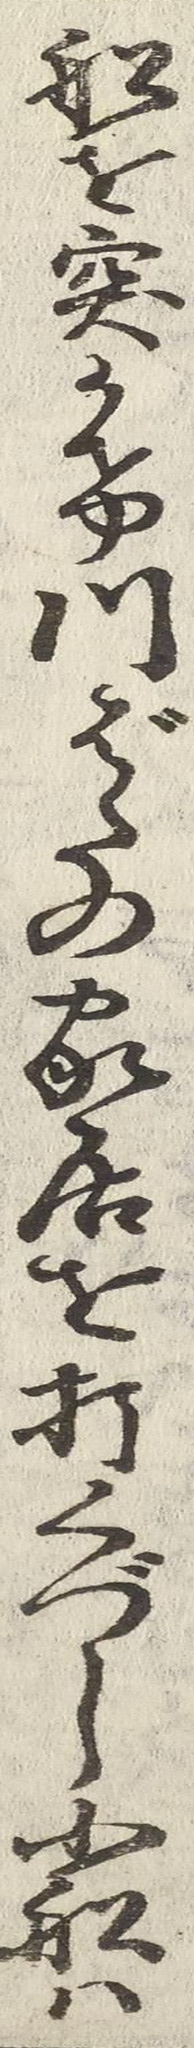船を突かけ川ばたの家居を打くづし小船は

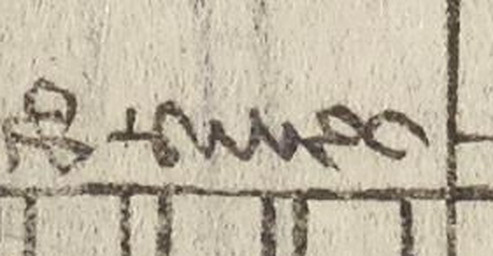西よこほり

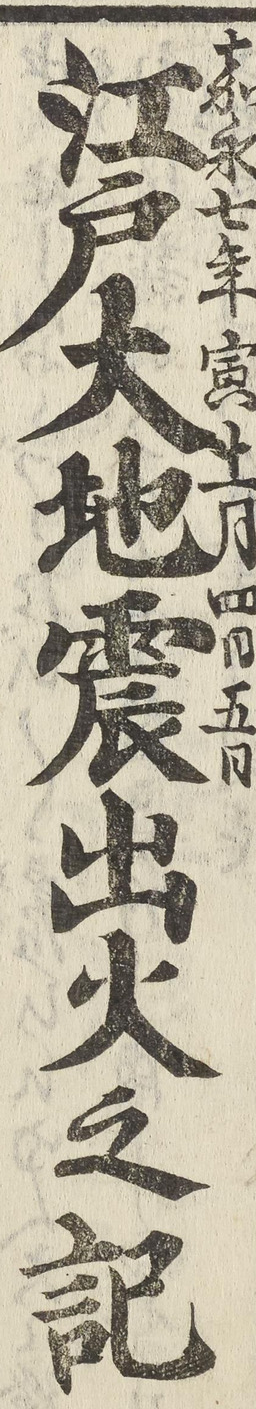江戸大地震出火之記
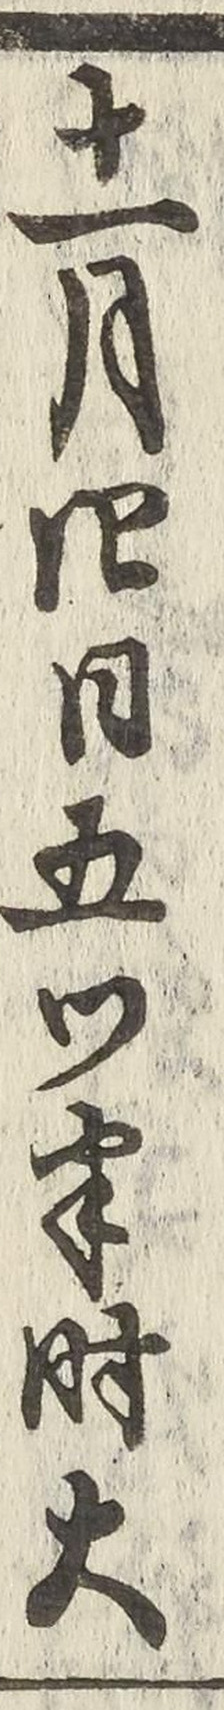十一月四日五ッ半時大
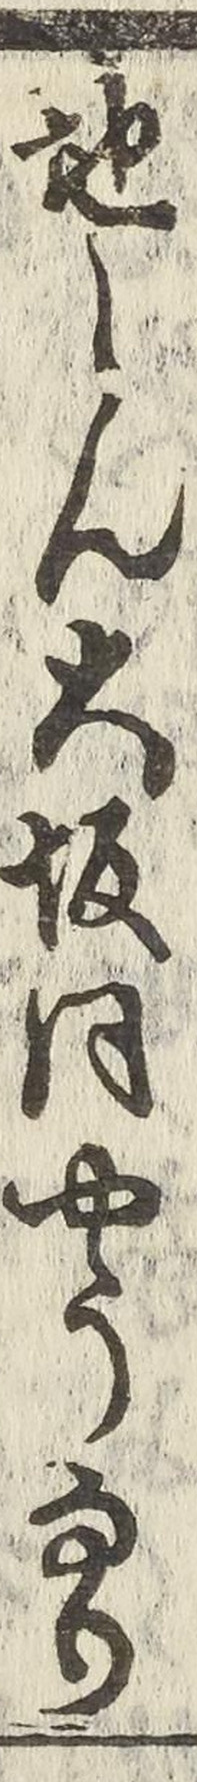地しん大坂同やうなり
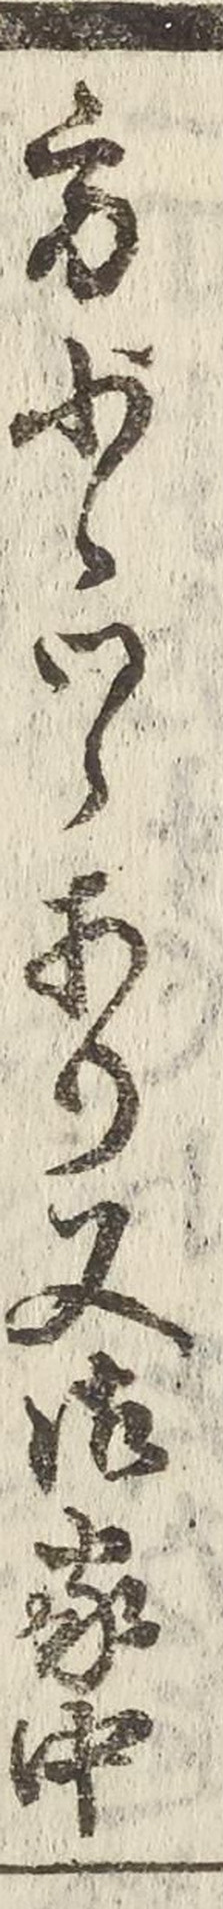方少々つゝあり又御家中
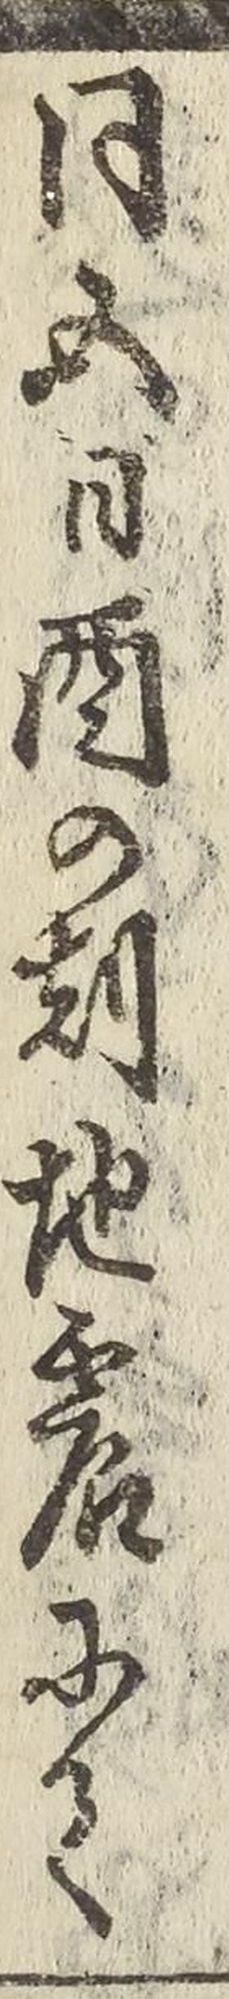同五日酉の刻地震にて

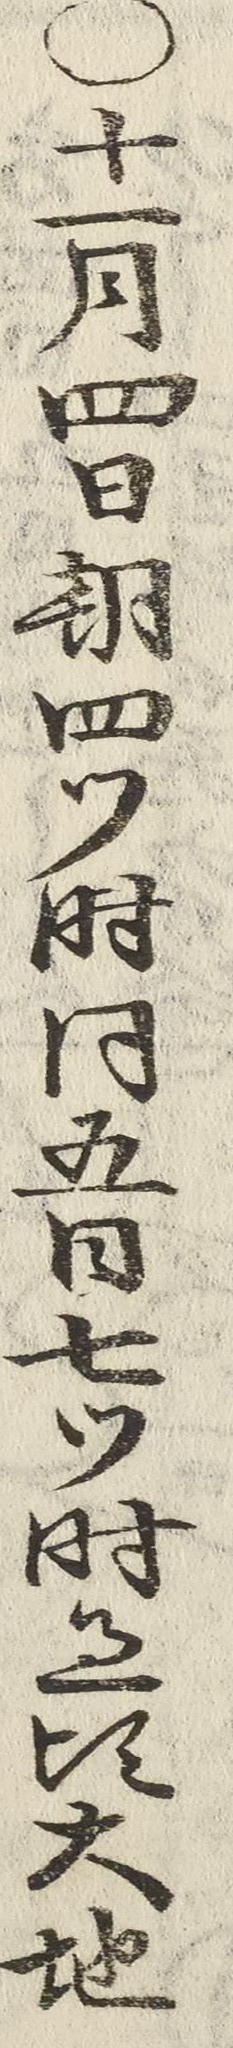○十一月四日朝四ツ時同五日七ツ時過頃大地
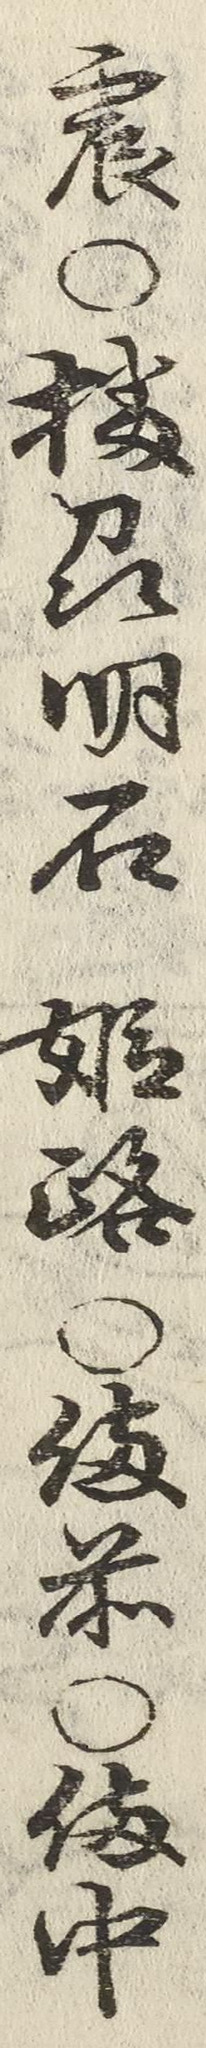震○播州明石姫路○備前○備中
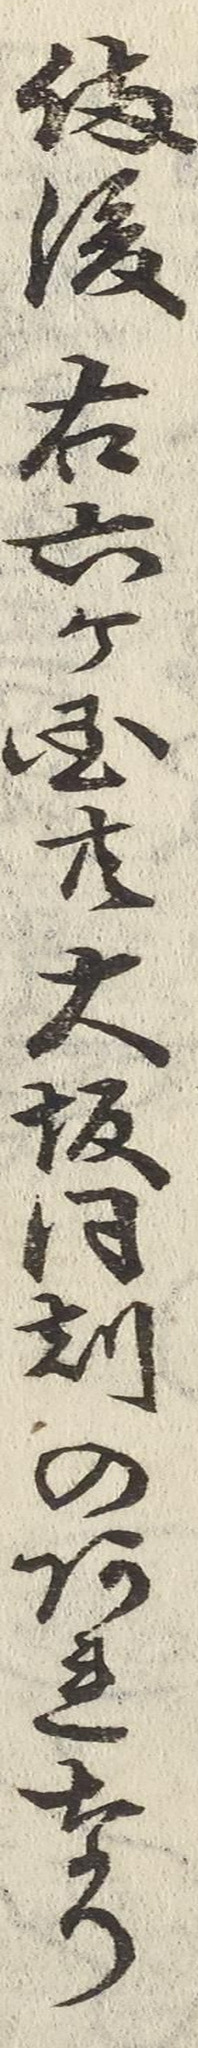備後右六ケ国共大坂同刻のあれなり
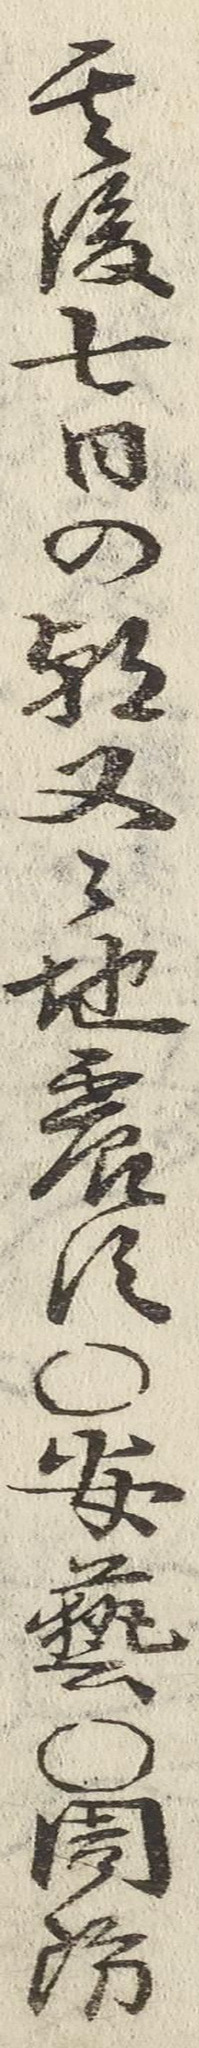其後七日の朝又々地震す○安芸○周防
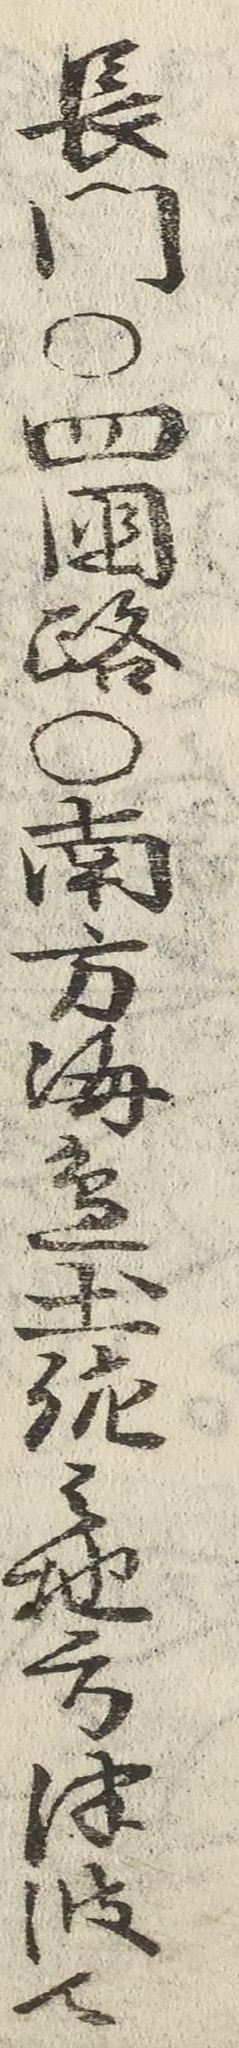長門○四国路○南方海辺土佐の地方津波て
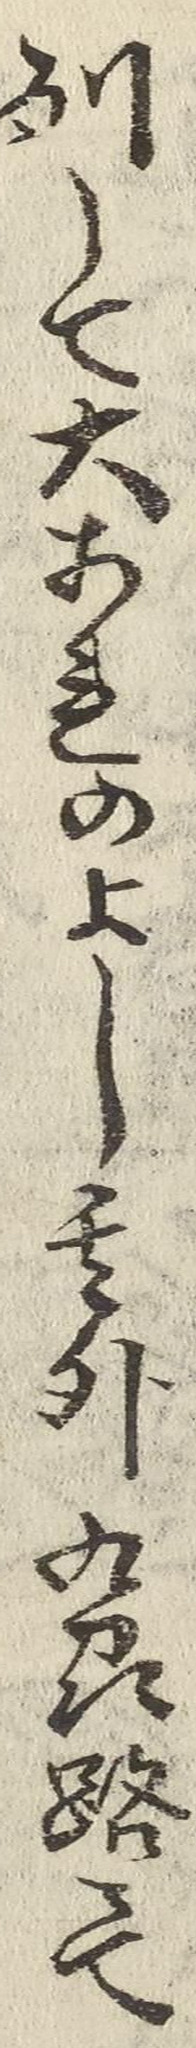別して大あれのよし其外九州路にて
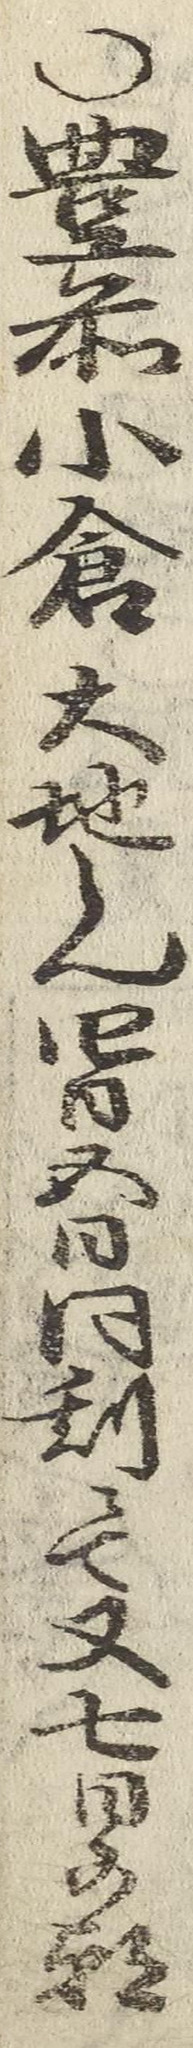○豊前小倉大地しん四日五日同刻にて又七日の朝
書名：大地震世直仕艸紙
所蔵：東京大学地震研究所図書室 Earthquake Research Institute Library, The University of Tokyo, JAPAN
